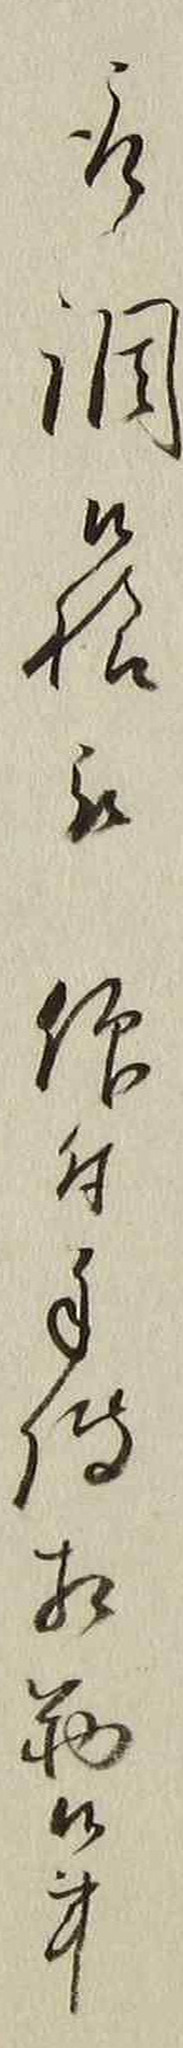取調候様被仰付手伝相勤候事
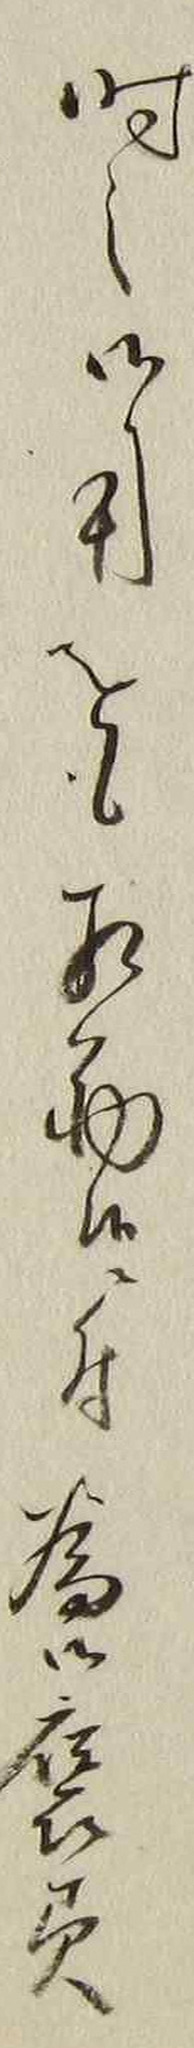時之御用をも相勤候ニ付為御褒美
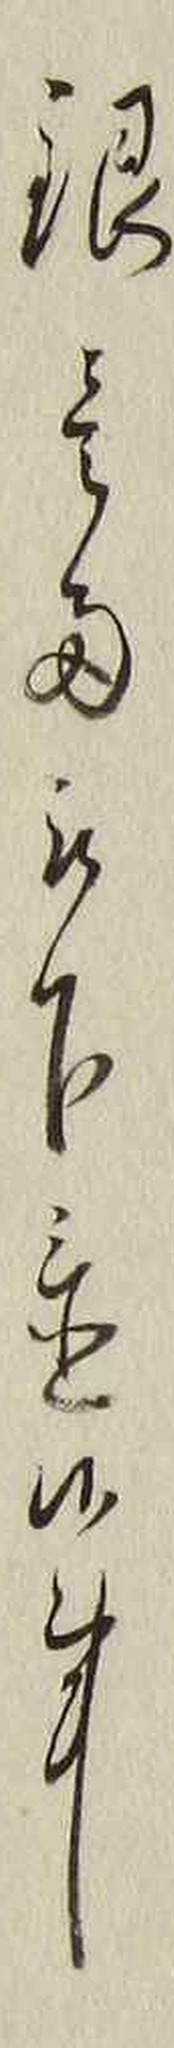銀壱両被下置候事
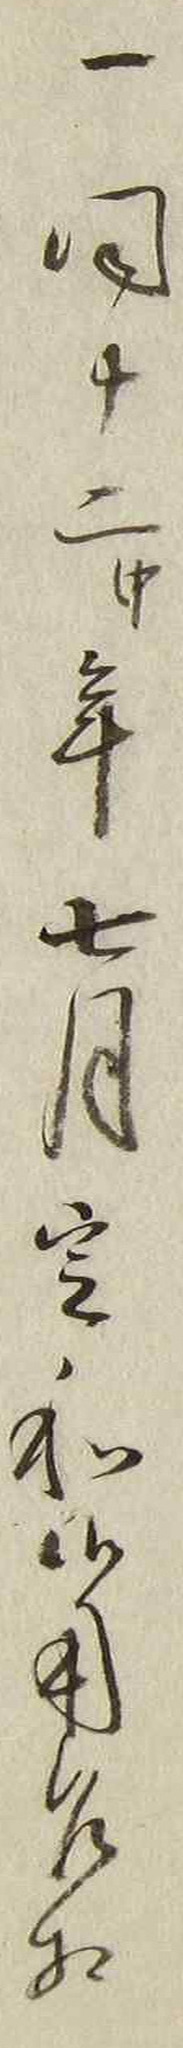一同十二申年七月定和御用乍相
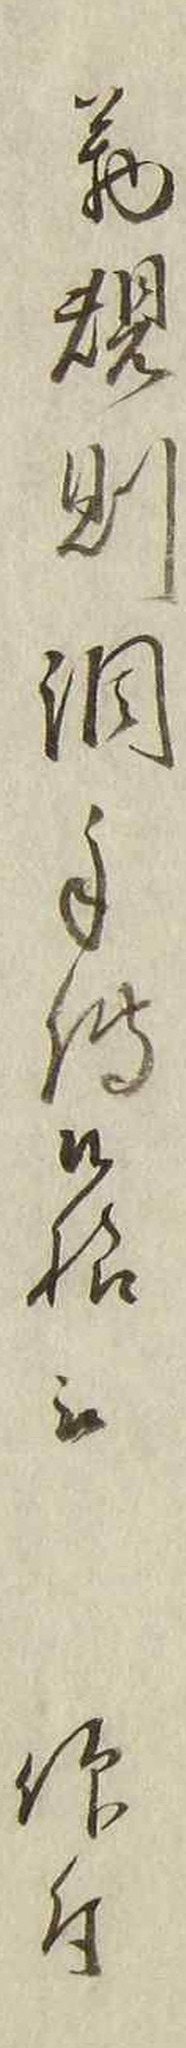勤規則調手伝候様被仰付

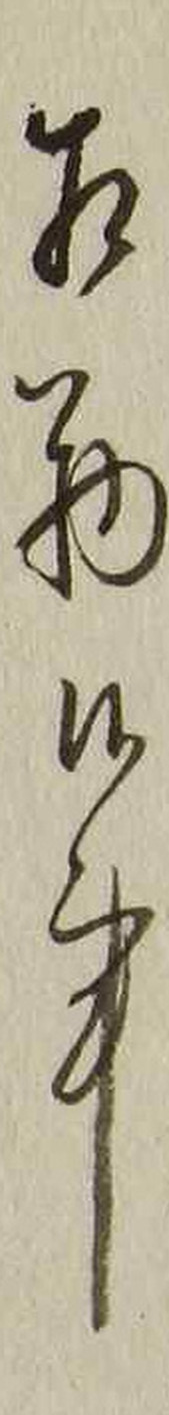相勤候事
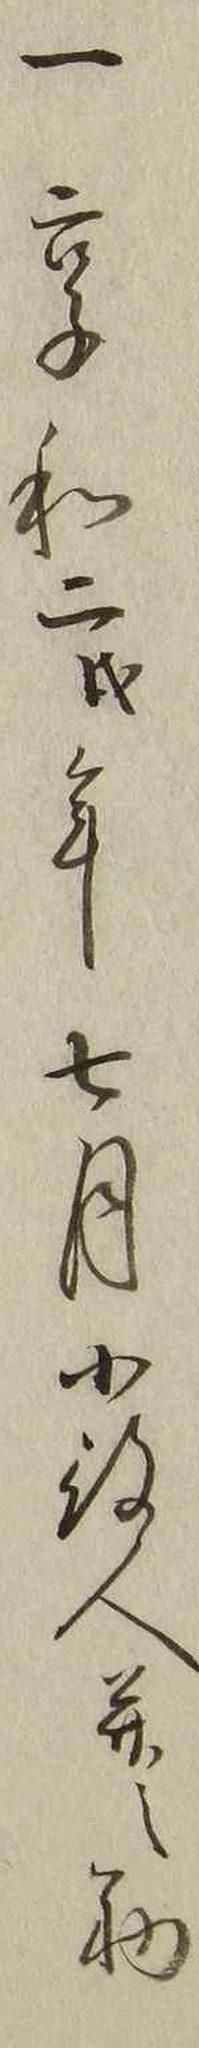一享和二戊年七月小役人并之勤
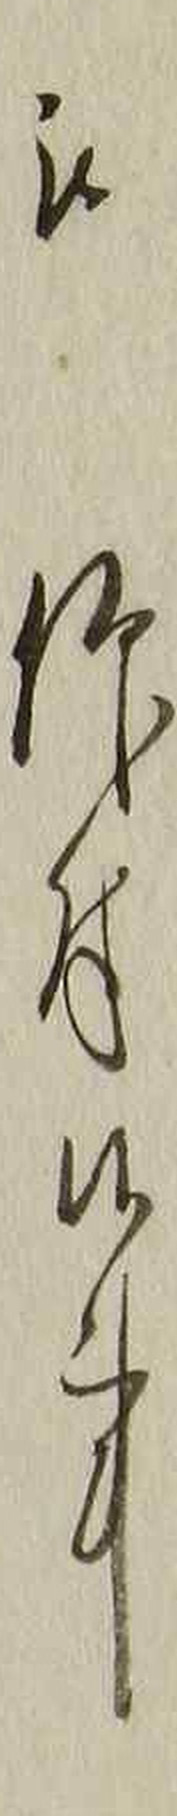被仰付候事
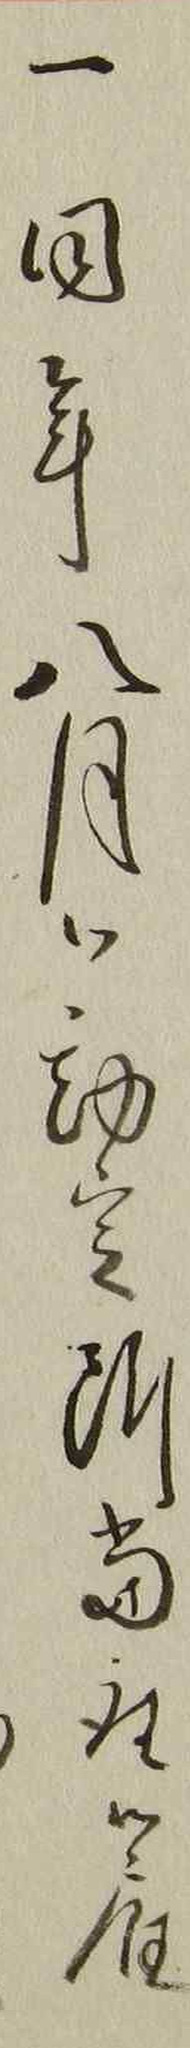一同年八月御勘定所当座御雇
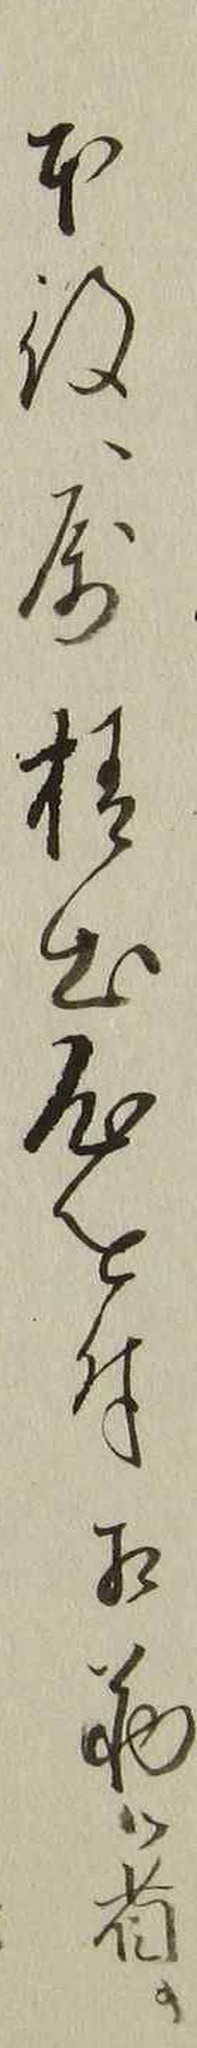本役へ属精出心を付相勤御省キ
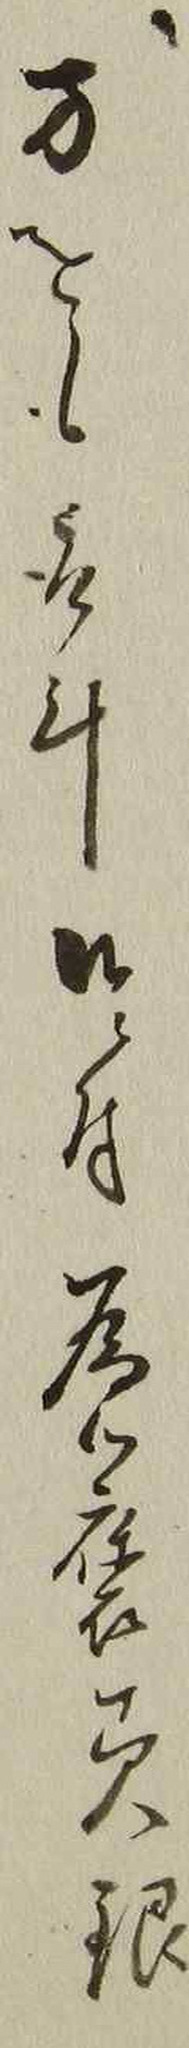方をも取計候ニ付為御褒美銀
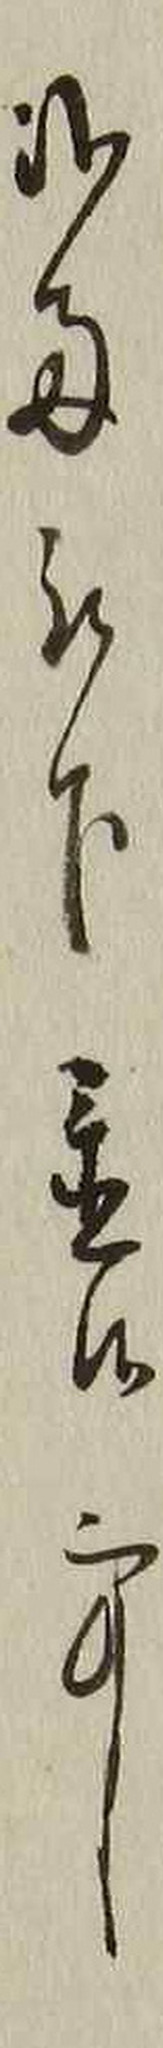弐両被下置候事
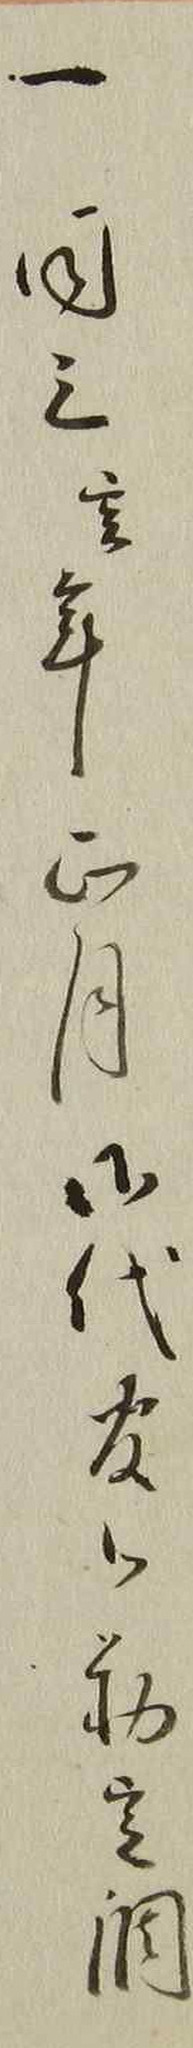一同三亥年正月御代官御勘定調
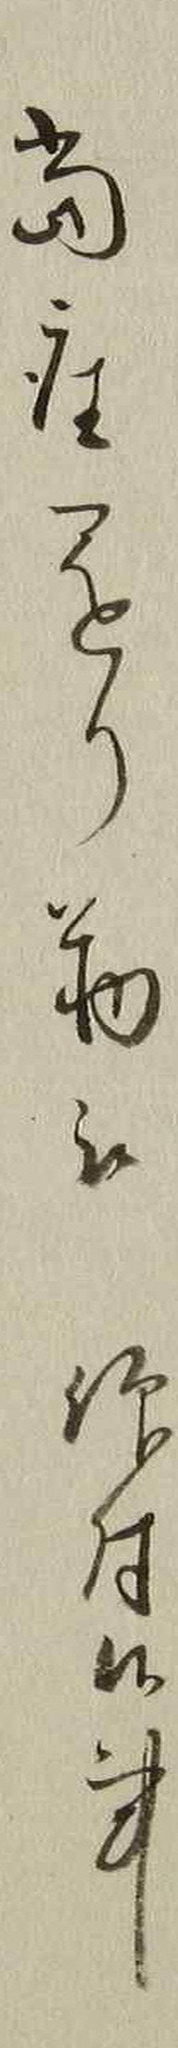当座懸り勤被仰付候事
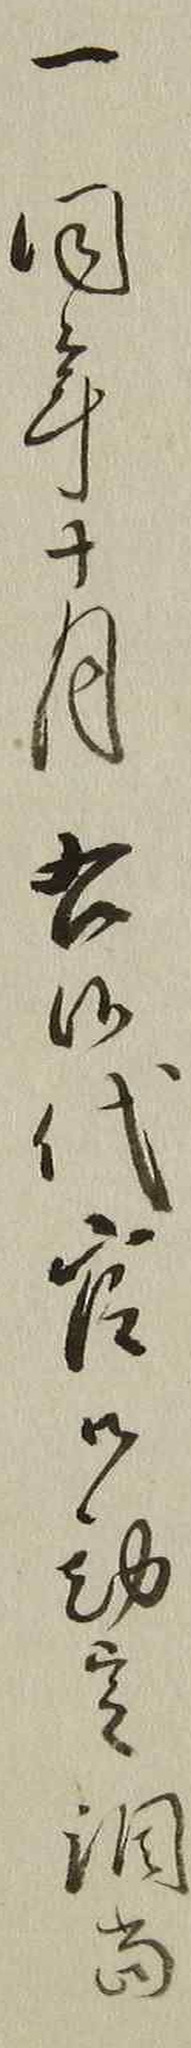一同年十月右御代官御勘定調当
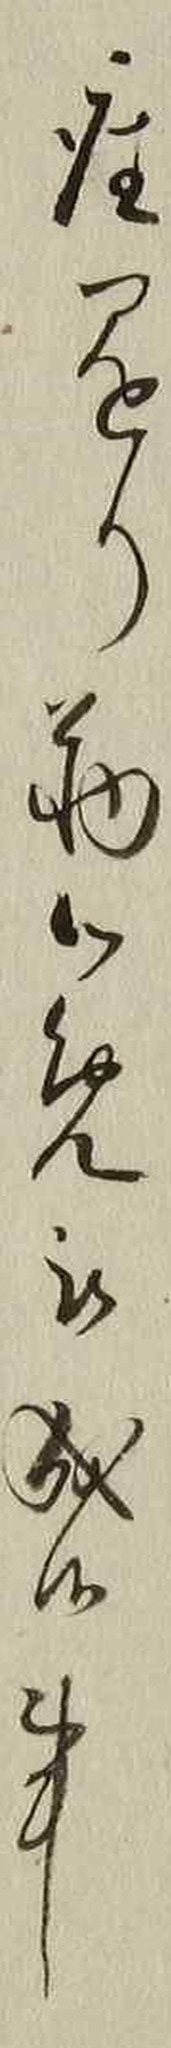座懸り勤御免被成候事
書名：諸士系譜　巻之132　た之部8
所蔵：会津若松市立会津図書館
